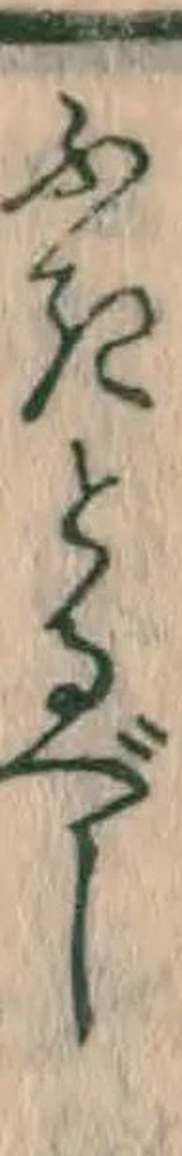ふきとるべし
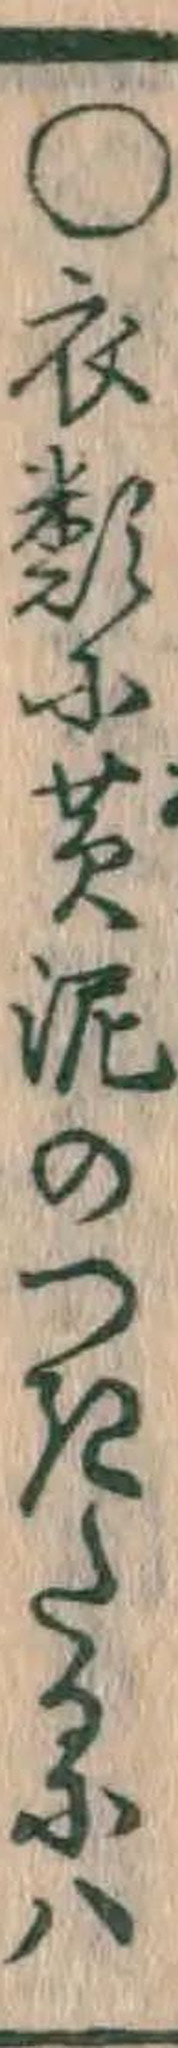○衣類に黄泥のつきたるには
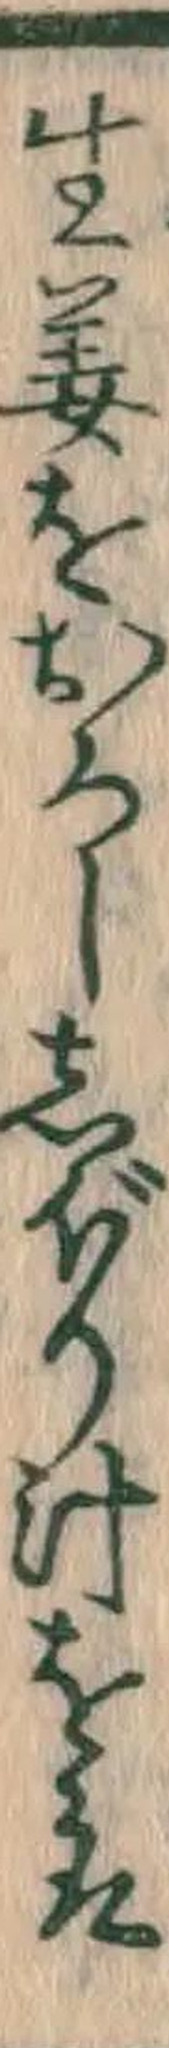生姜をおろししぼり汁を取
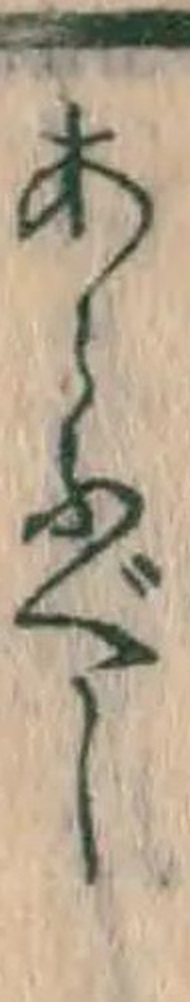あらふべし
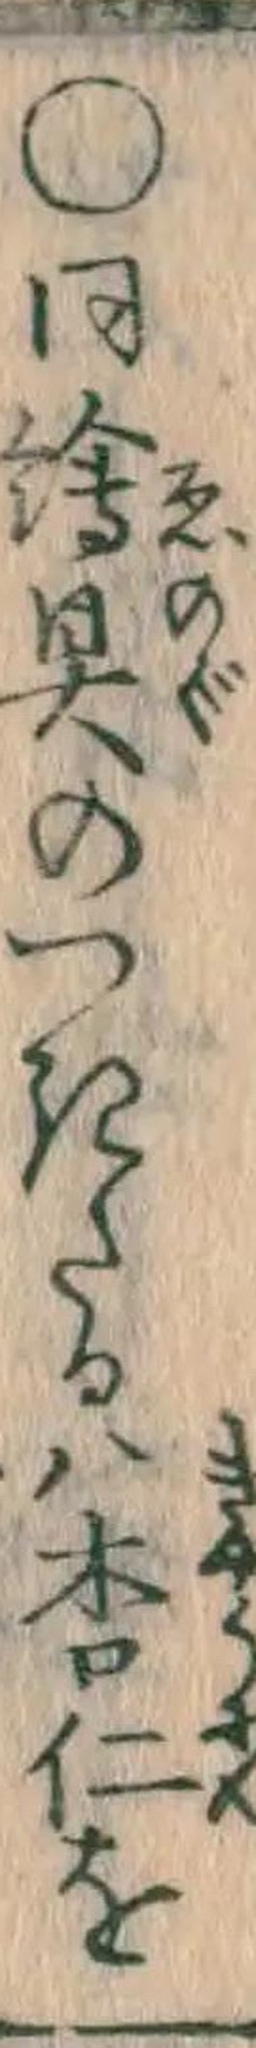○同絵具のつきたるは杏仁を
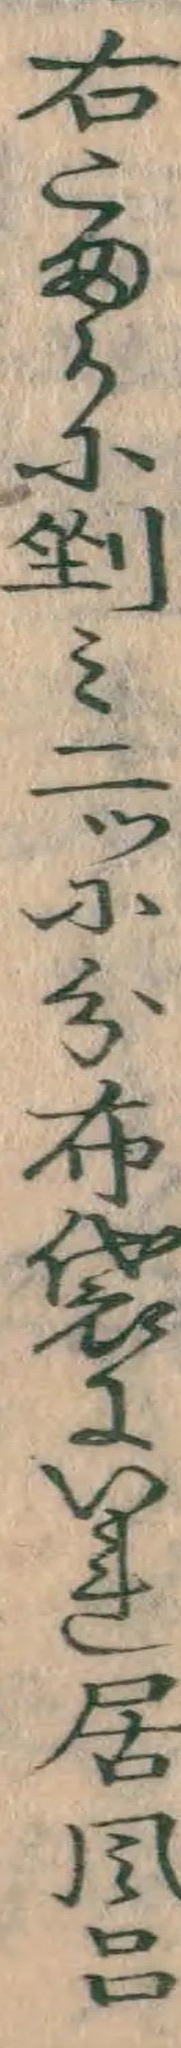右こまかに剉み二ッに分布袋にいれ居風呂
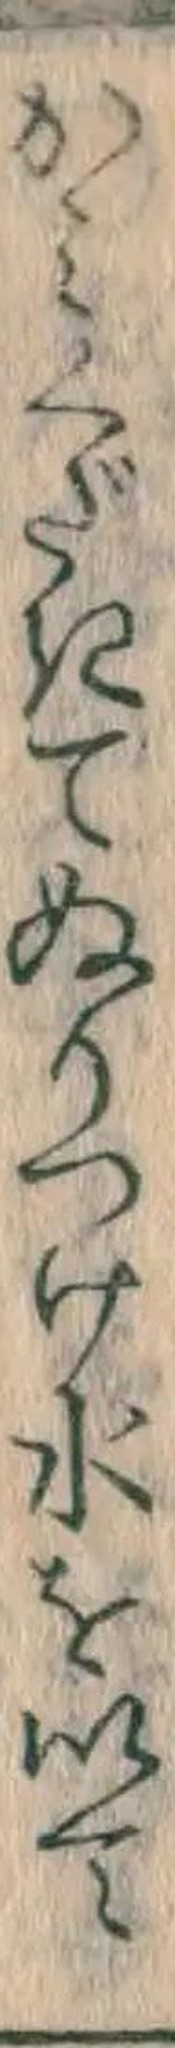かみくだきてぬりつけ水を以て
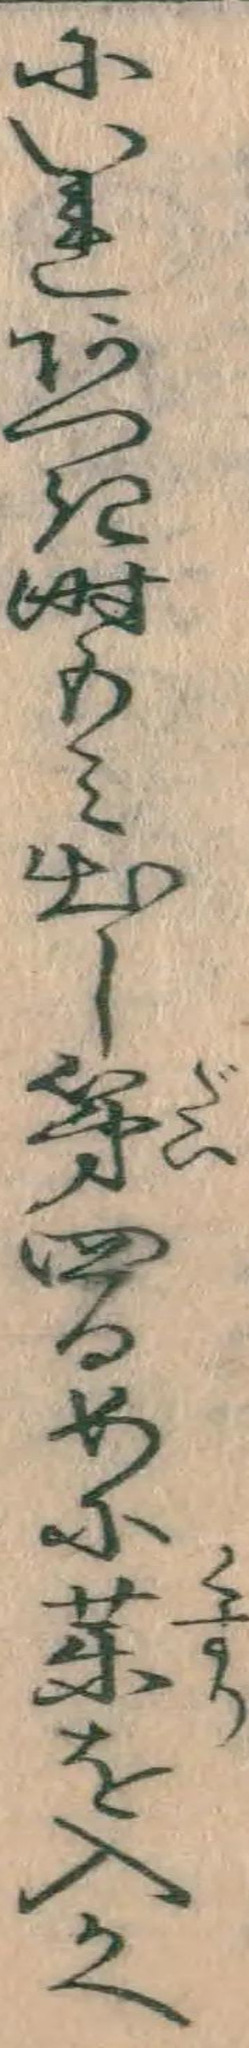にいれあつき時もみ出し第四るめに薬を入かへ
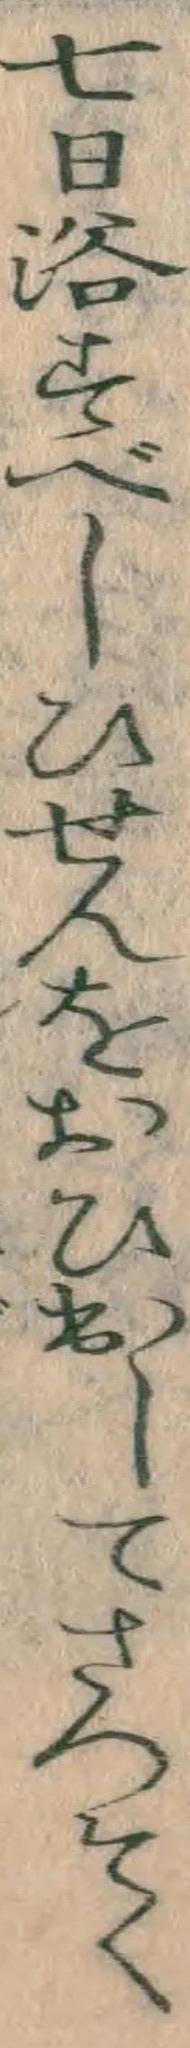七日浴すべしひせんをおひ出してさつそく
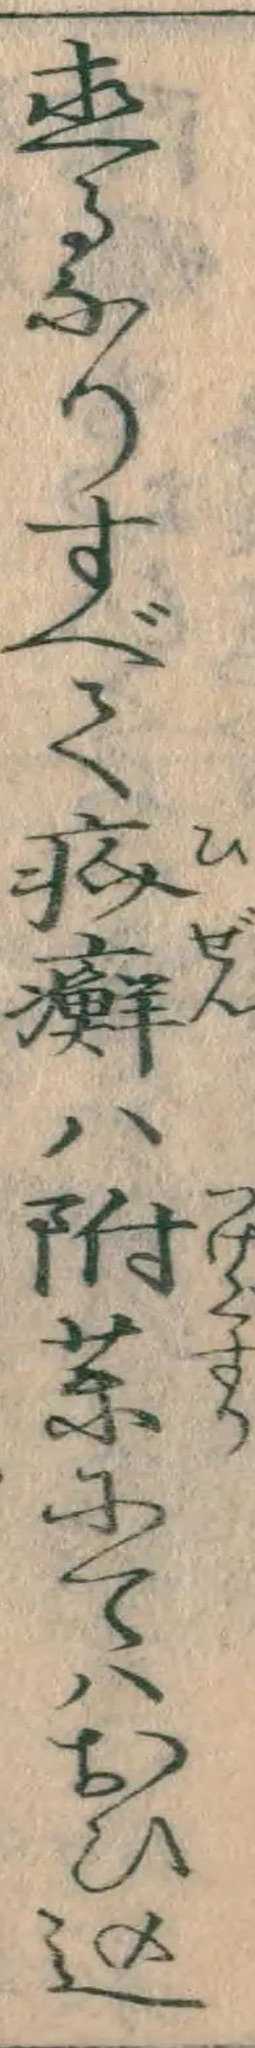直るなりすべて疥癬は附薬にてはおひ込
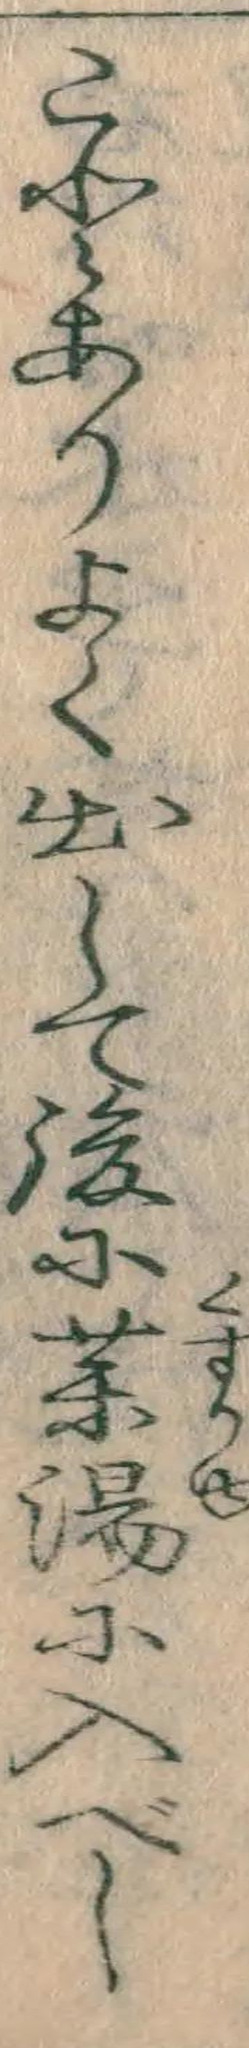ことありよく出して後に薬湯に入べし
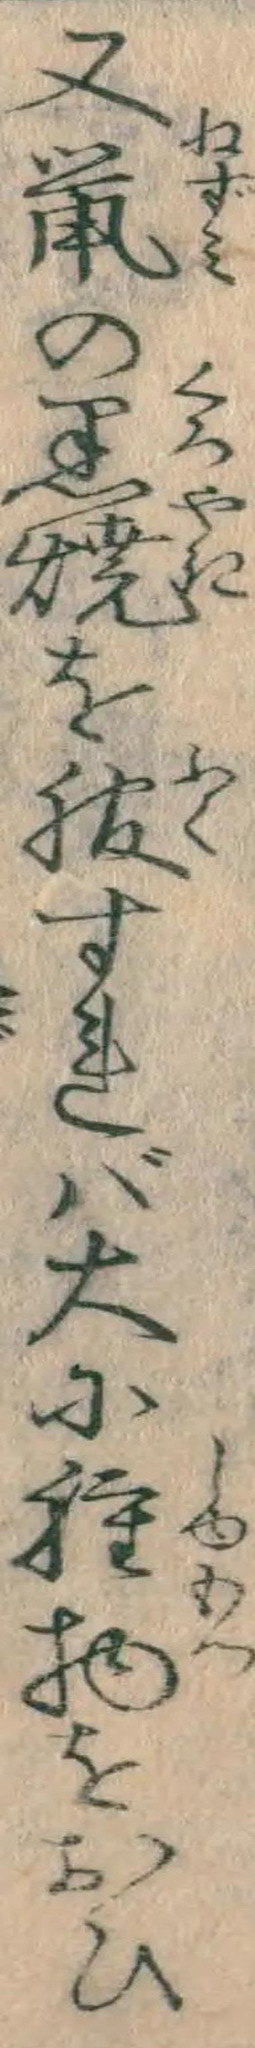又鼠の黒焼を服すれば大に腫物をおひ
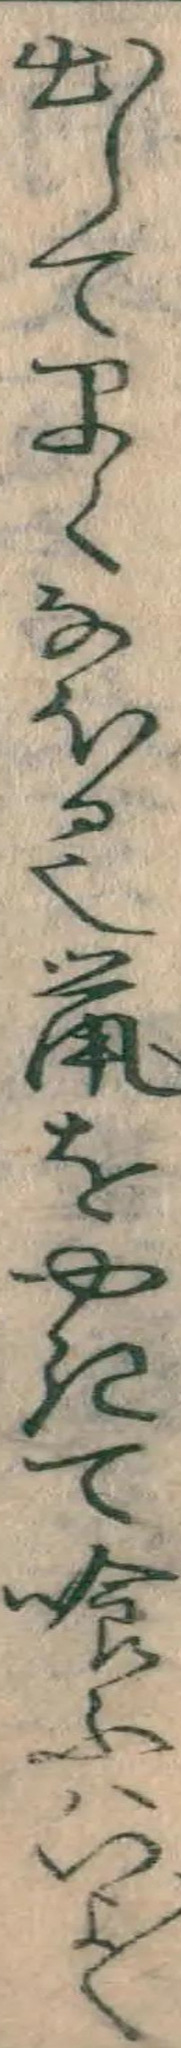出して早くなほる也鼠をやきて喰ふはいよ〳〵
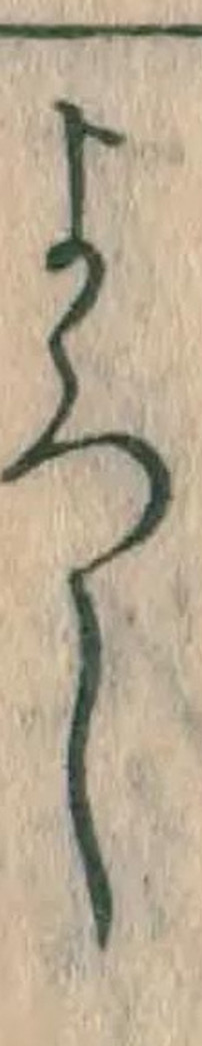よろし
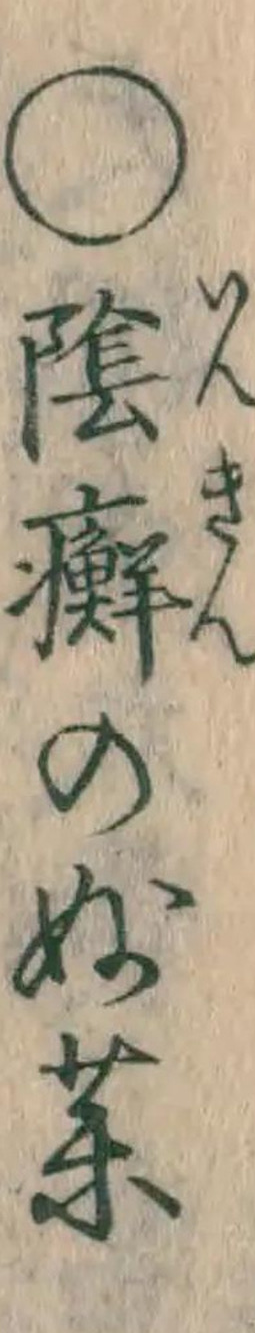○陰癬の妙薬

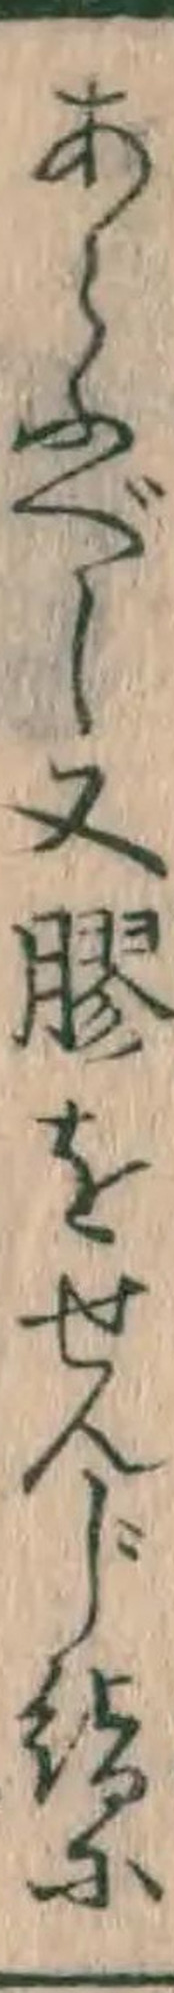あらふべし又膠をせんじ絹に
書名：広益秘事大全 3巻. [3]
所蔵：国立国会図書館 National Diet Library, JAPAN
